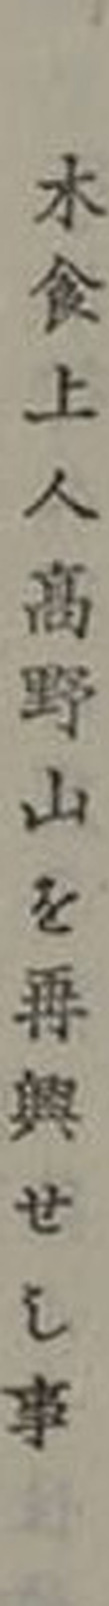木食上人高野山を再興せし事
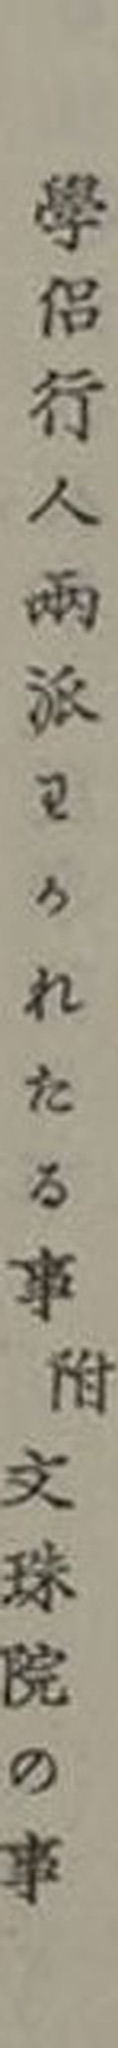学侶行人両派わかれたる事附文珠院の事
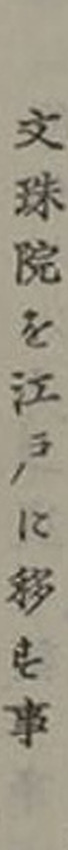文珠院を江戸に移す事
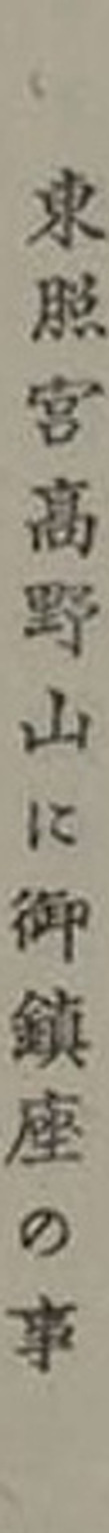東照宮高野山に御鎮座の事
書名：五事略 上
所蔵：University of the Ryukyus Library
